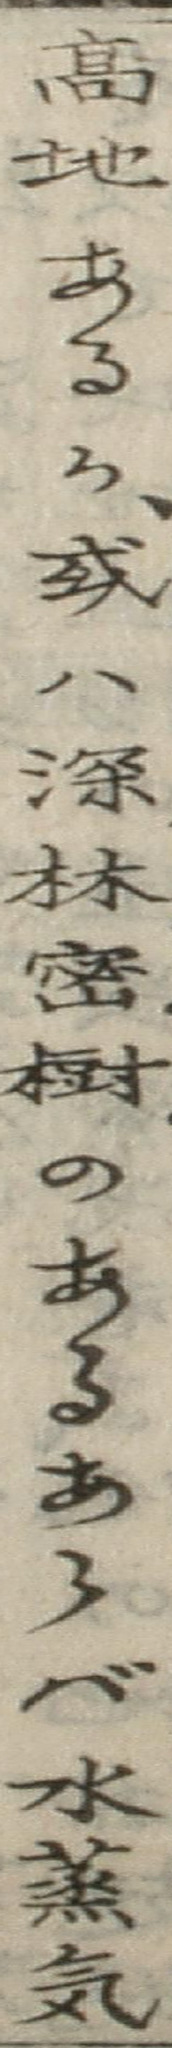高地あるか、或は深林密樹のあるあらば、水蒸気
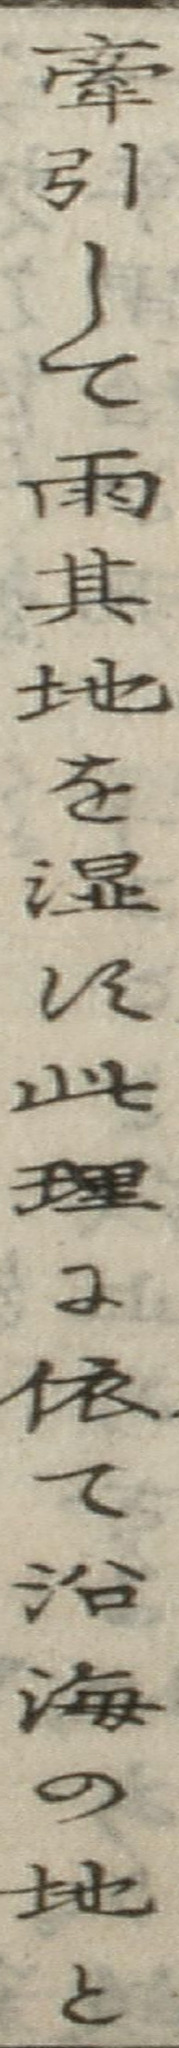牽引して雨其地を湿す、此理に依て沿海の地と
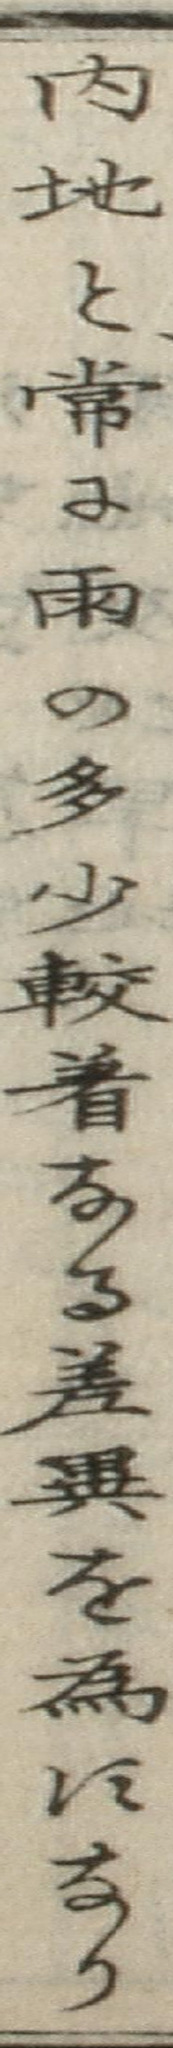内地と、常に雨の多少較著なる差異を為すなり
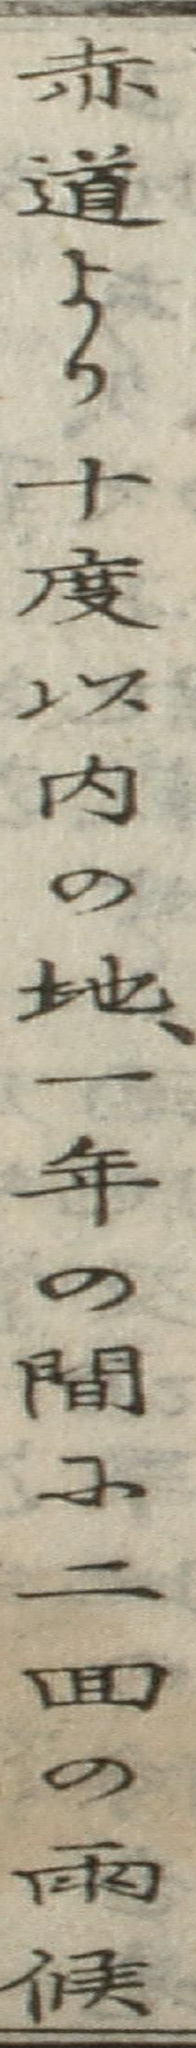赤道より十度以内の地一年の間に二回の雨候
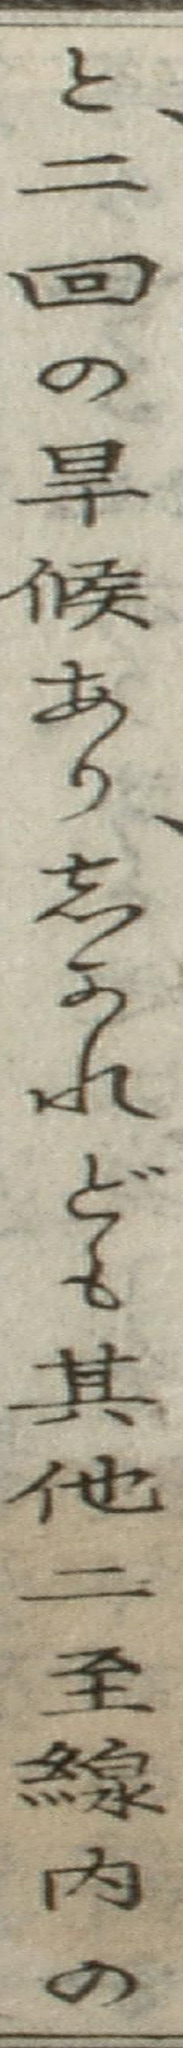と、二回の旱候あり、しかれども其他二至線内の
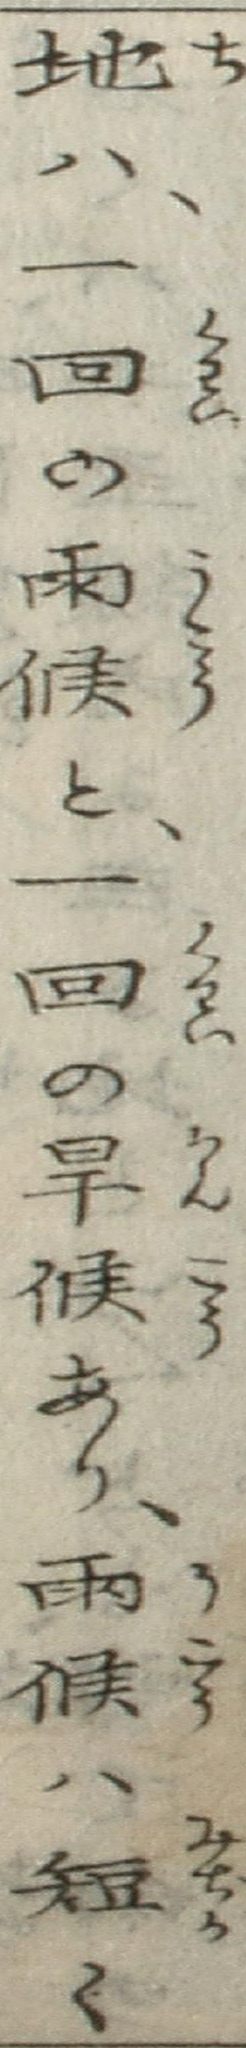地は、一回の雨候と、一回の旱候あり、雨候は短く
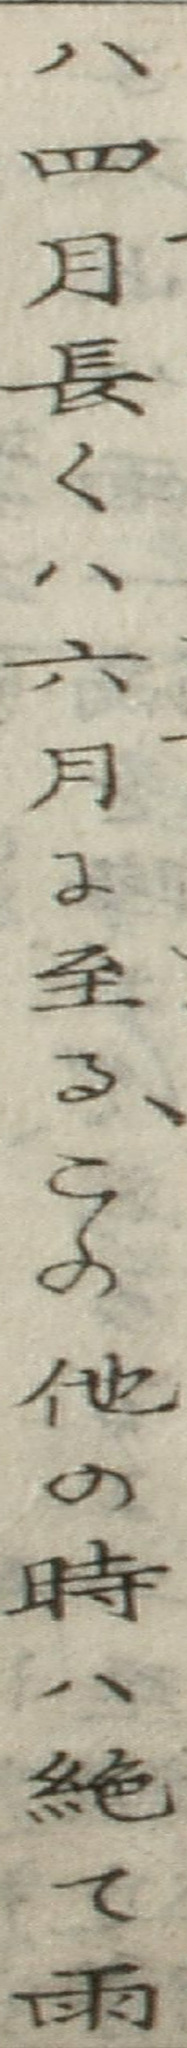は四月長くは六月に至る、この他の時は絶て雨
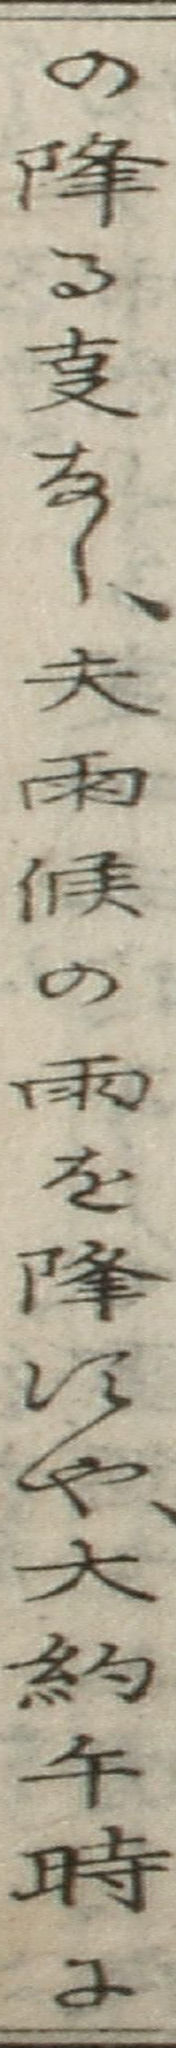の降る事なし、夫雨候の雨を降すや、大約午時に

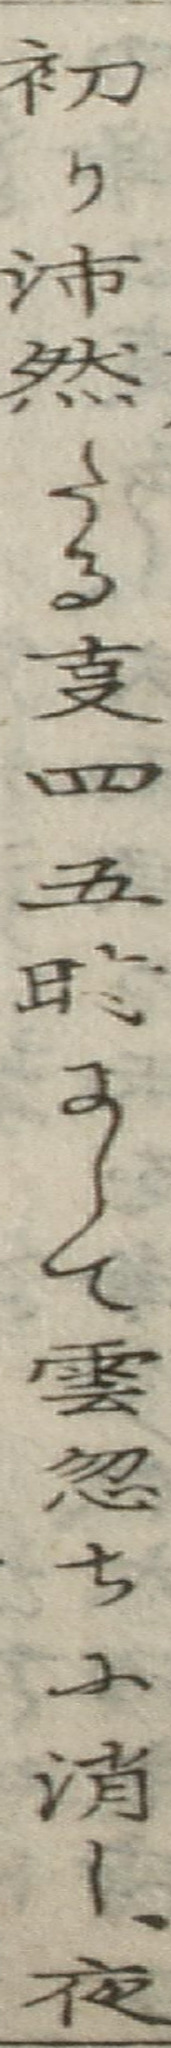初り沛然たる事四五時にして、雲忽ちに消し、夜
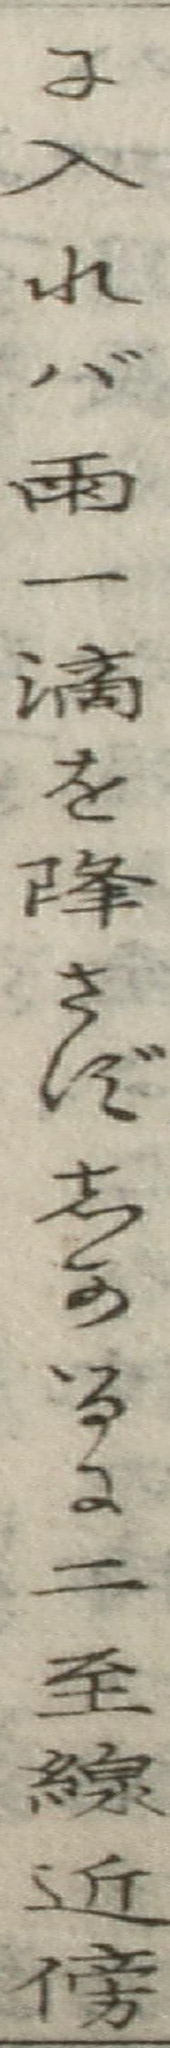に入れば雨一滴を降さず、しかるに二至線近傍
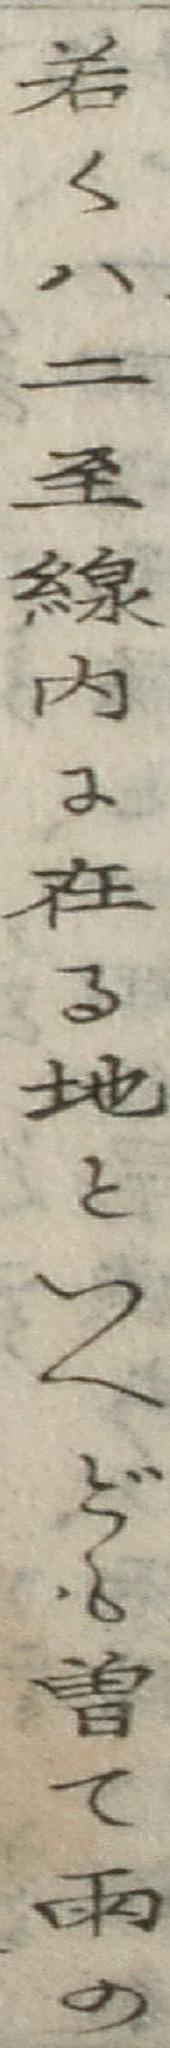若くは、二至線内に在る地といへども、曽て雨の
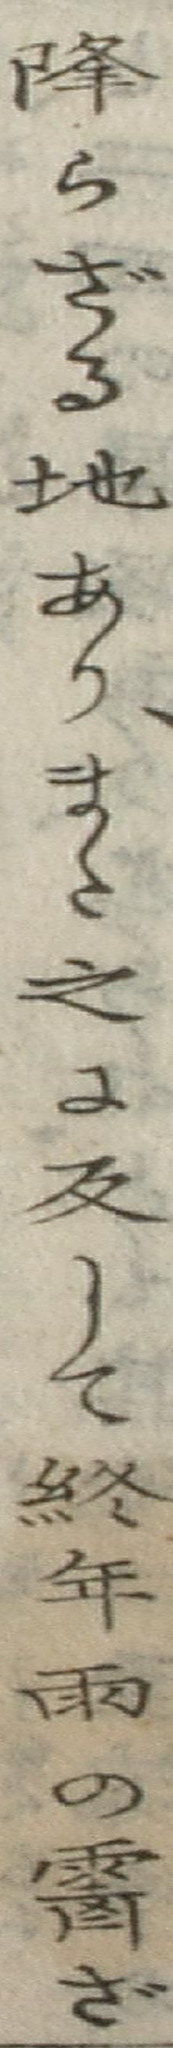降らざる地あり、また之に反して終年雨の霽ざ
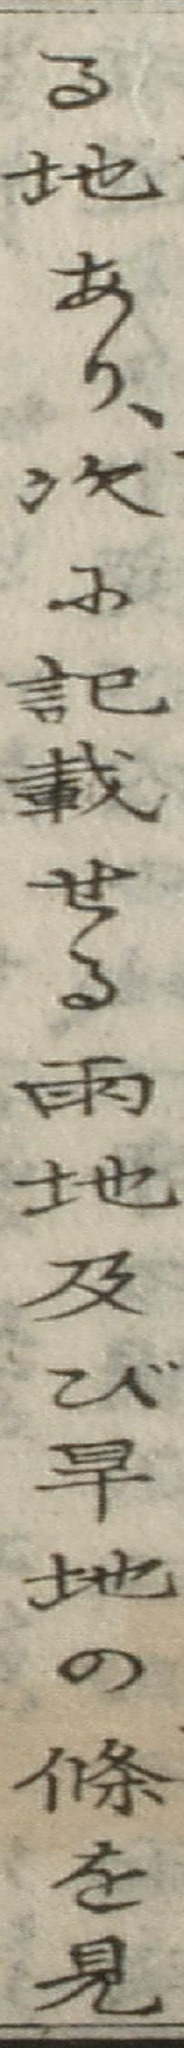る地あり、次に記載せる雨地及び旱地の條を見
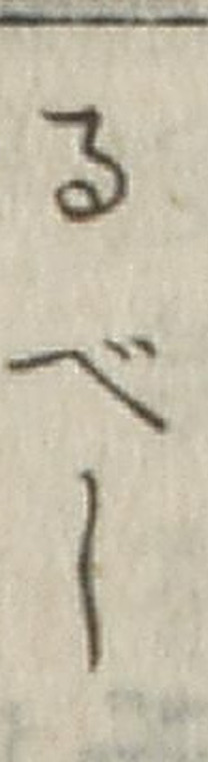るべし
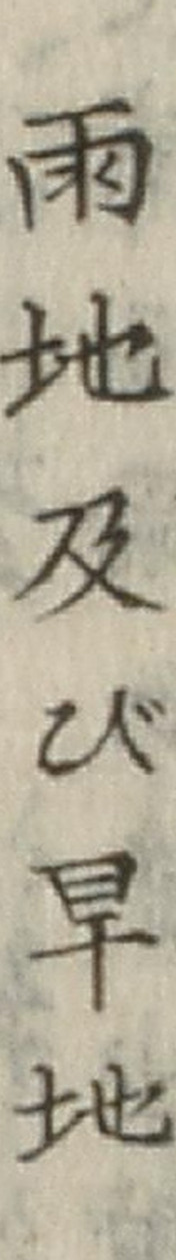雨地及び旱地
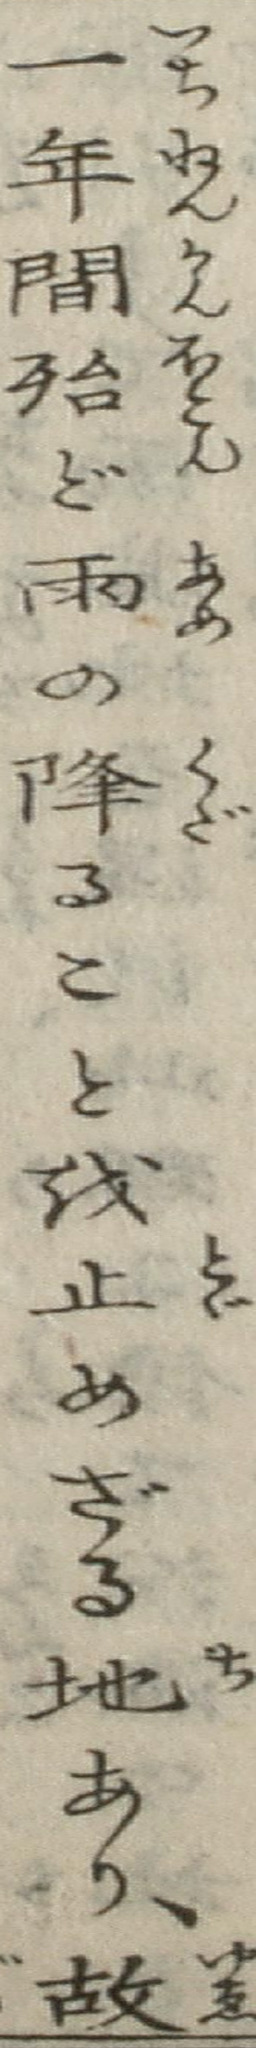一年間殆ど雨の降ることを止めざる地あり、故
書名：訓蒙　天然地理學　下
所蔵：東京大学地震研究所図書室 Earthquake Research Institute Library, The University of Tokyo, JAPAN
